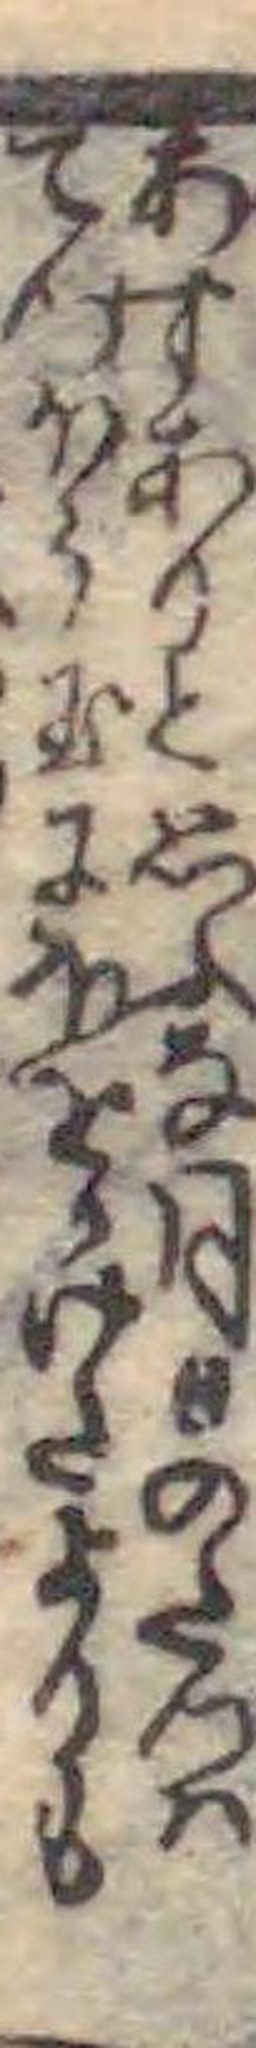てけほう玉にほをかけたよりも
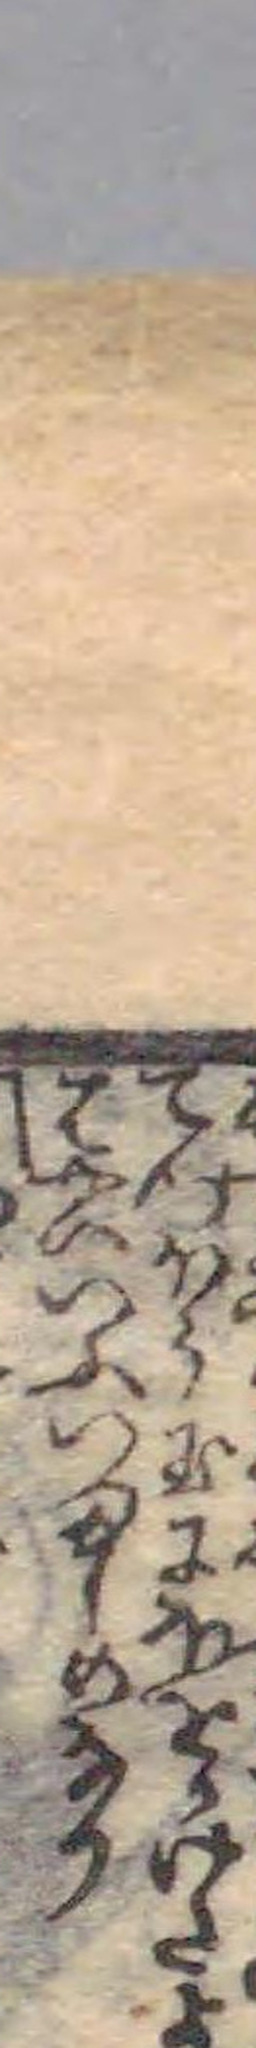はやいいふいましめなり
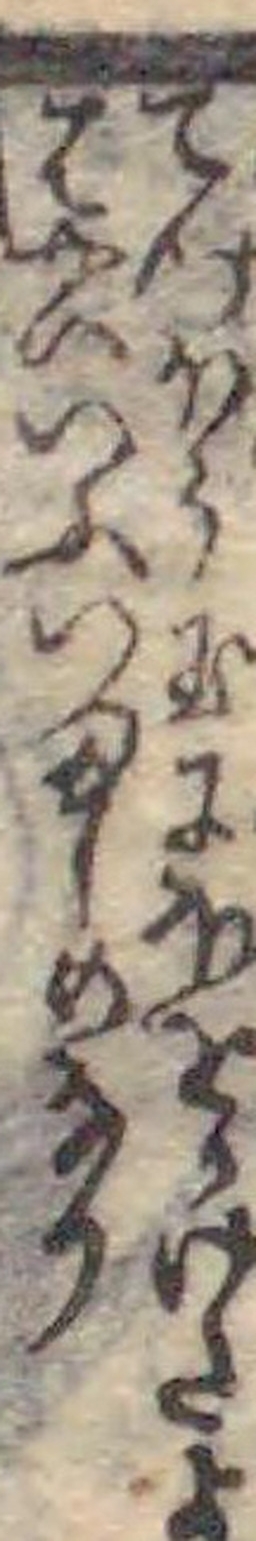はやいいふいましめなり
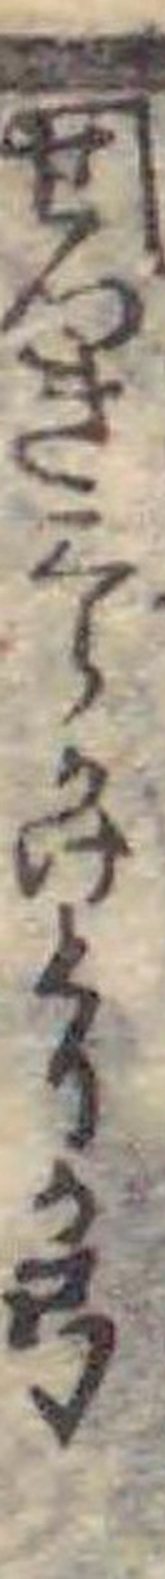〽せつき三郎かけとりか弓
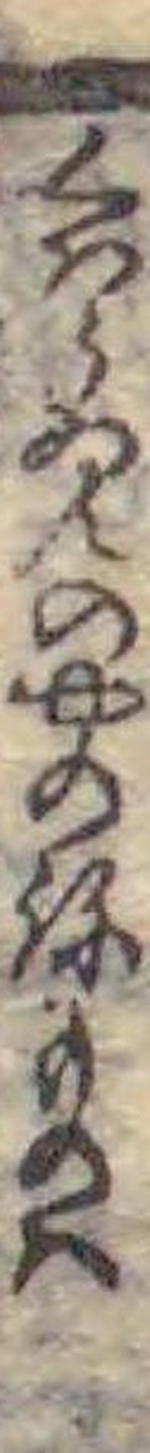くはうゐんのやのねものは
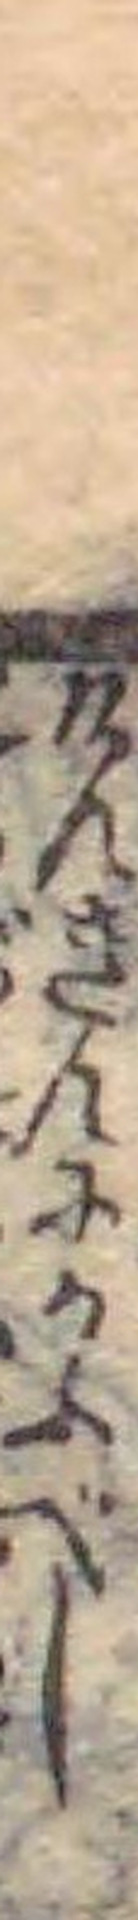けんきんにかふべし
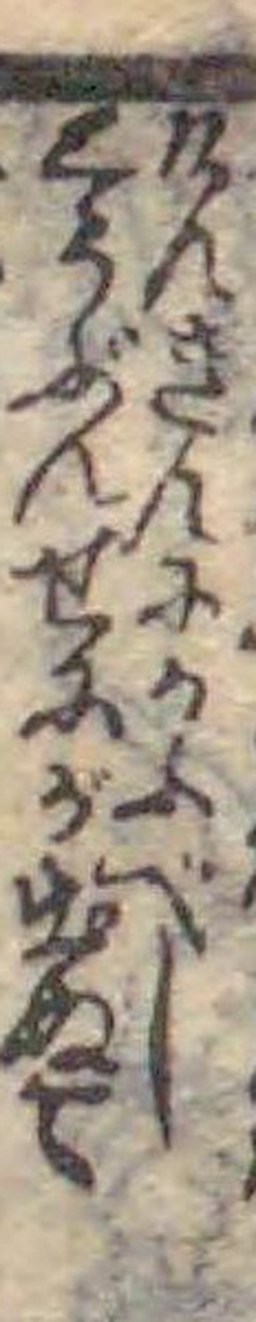こうぶんせにが出ぬて
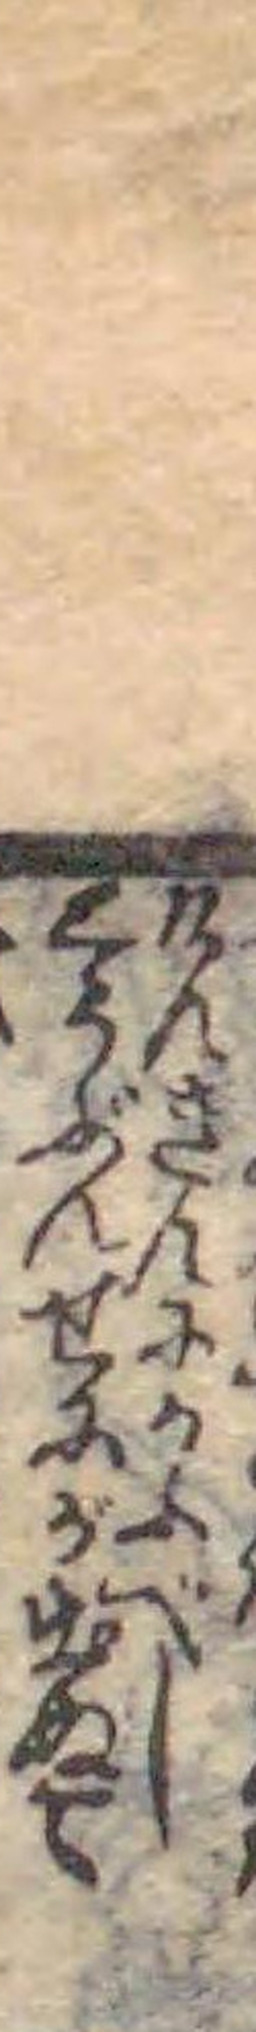こうぶんせにが出ぬて
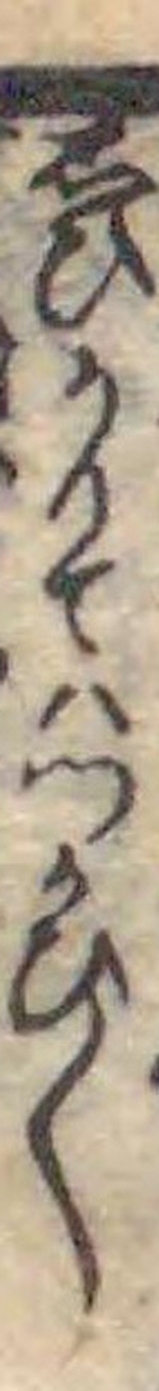思ひかりてはつかひ〳〵
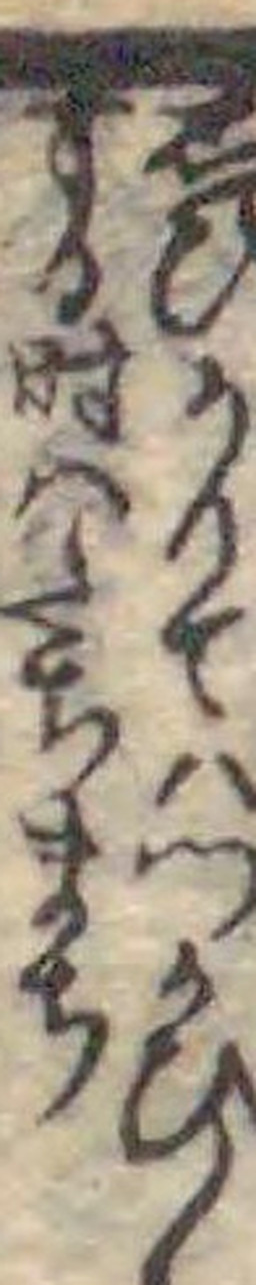する時はたちまち
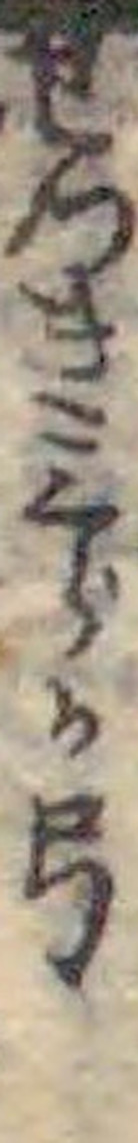せつき三郎か弓
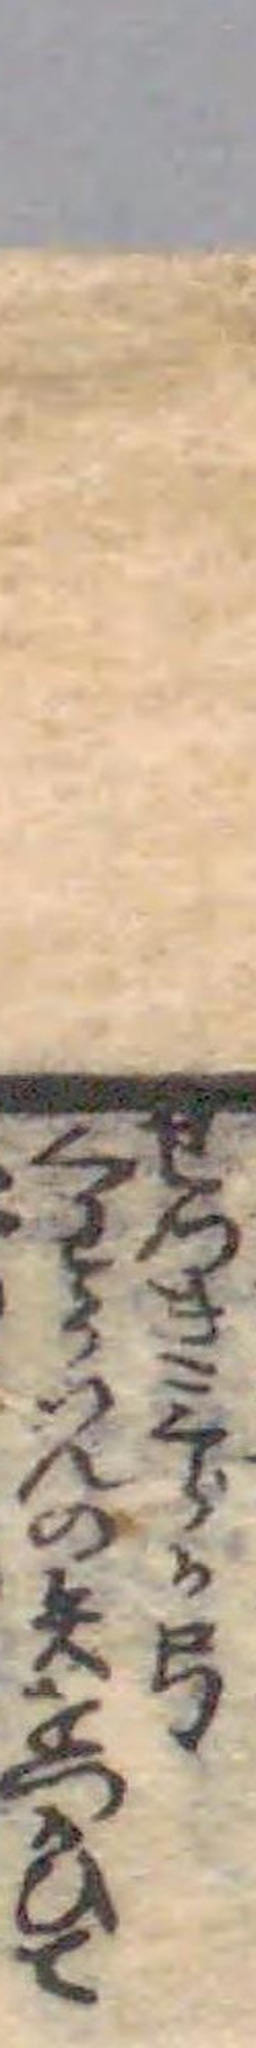くわうはんの矢をつかひて
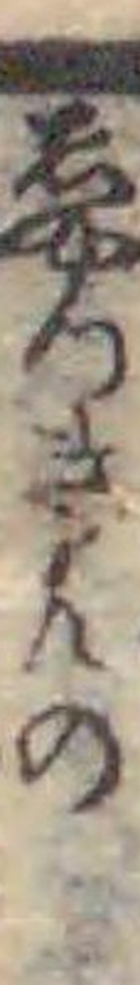しやつきんの
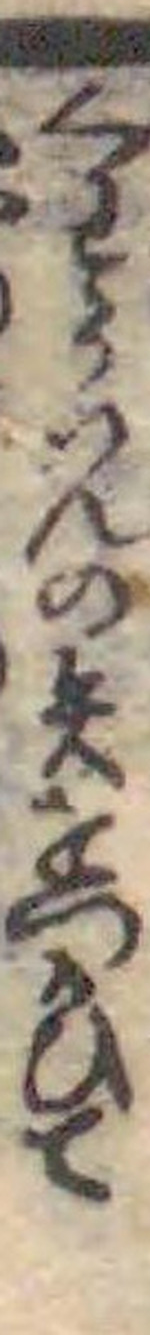くわうはんの矢をつかひて
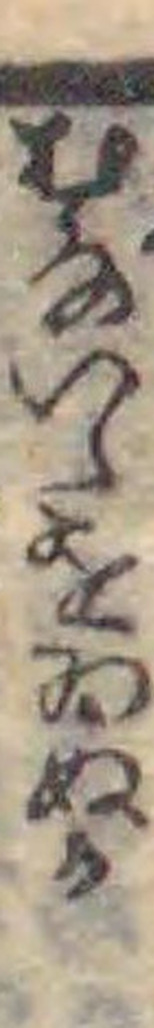むないたをゐぬか
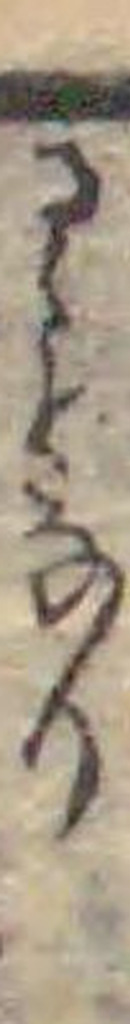るゝとなり
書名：身体開帳略縁起 : 3巻
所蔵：国立国会図書館 National Diet Library, JAPAN
